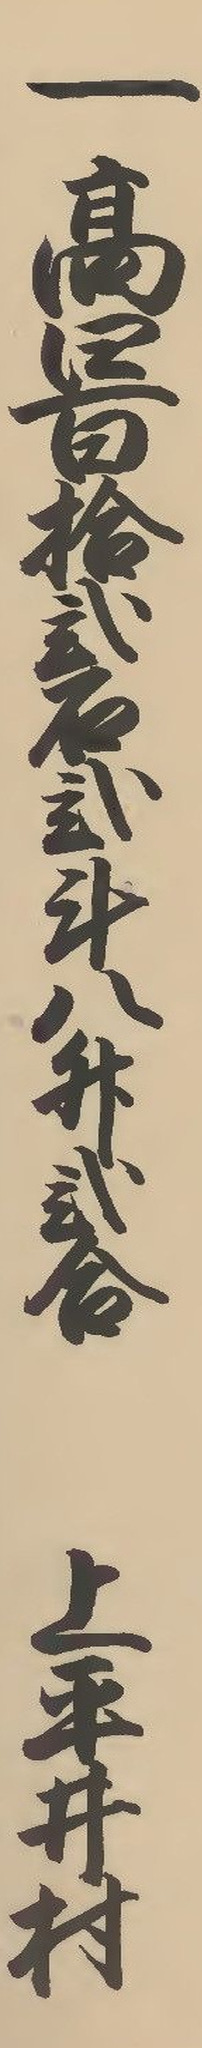一高四百拾弐石弐斗八升弐合上平井村
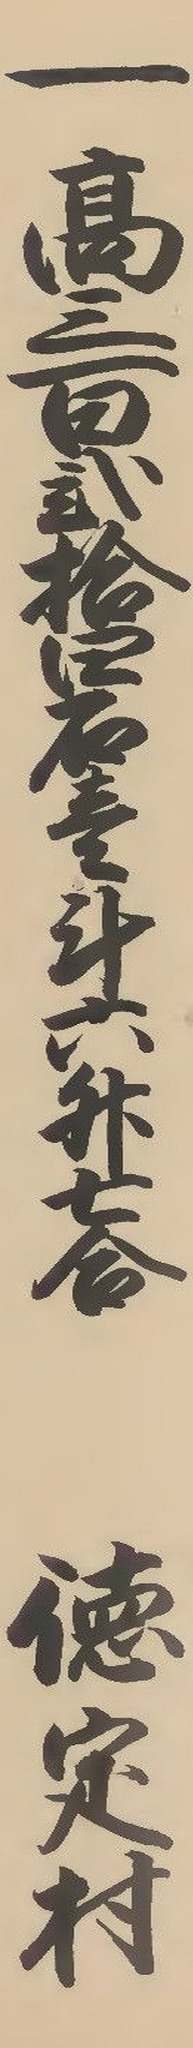一高三百弐拾四石壱斗六升七合徳定村
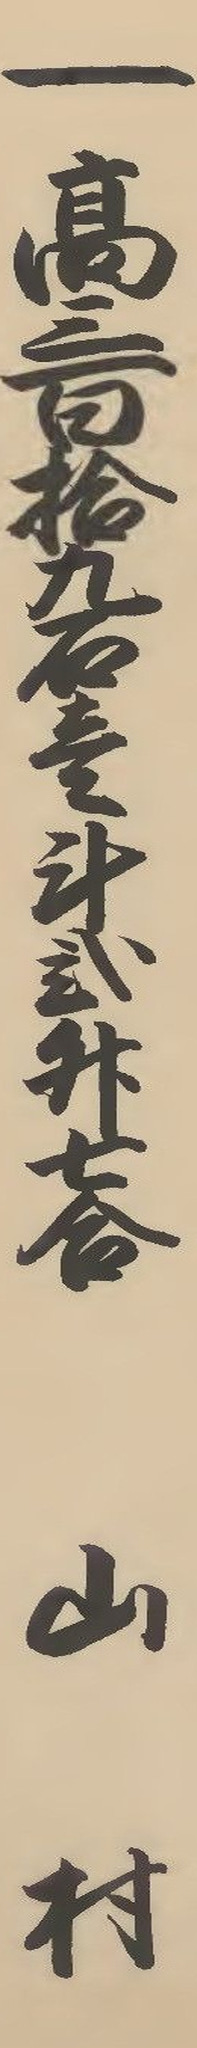一高三百拾九石壱斗弐升七合山村
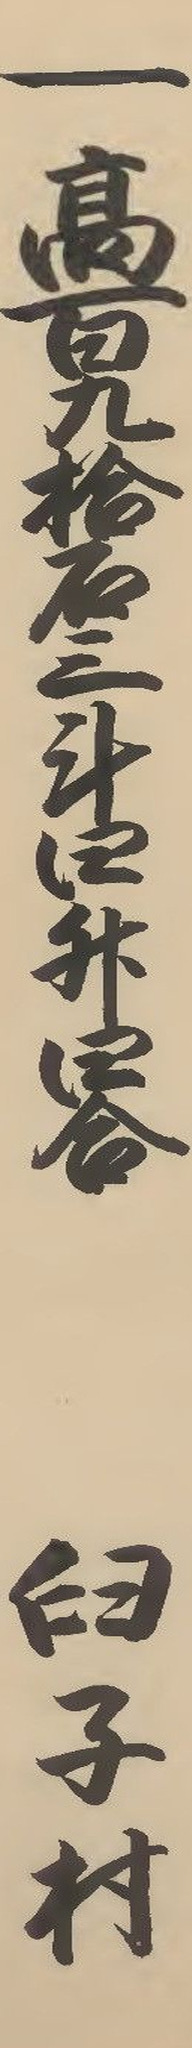一高百九拾石三斗四升四合臼子村
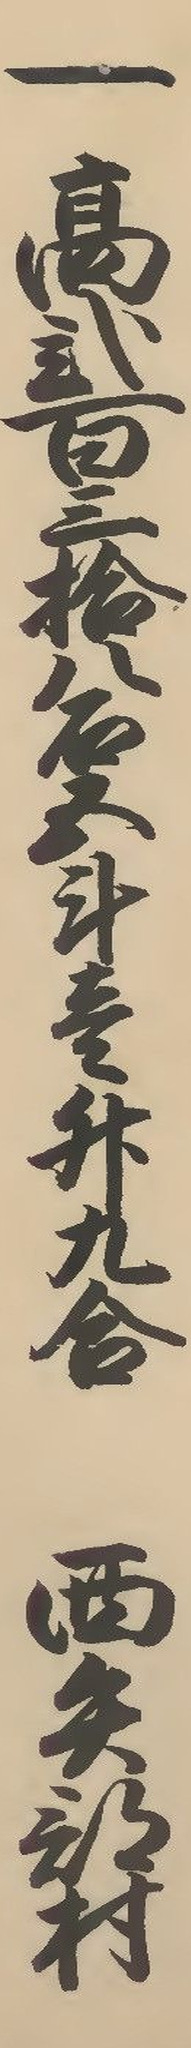一高弐百三拾八石五斗壱升九合西矢部村

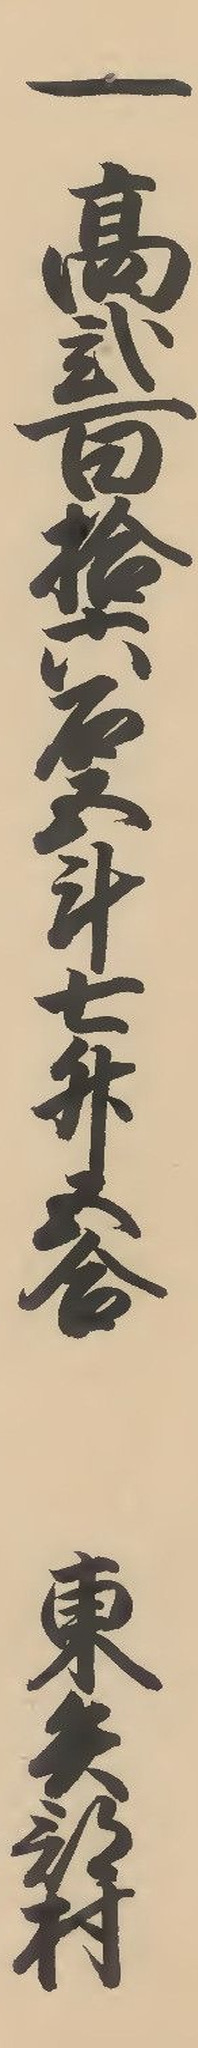一高弐百拾六石五斗七升五合東矢部村
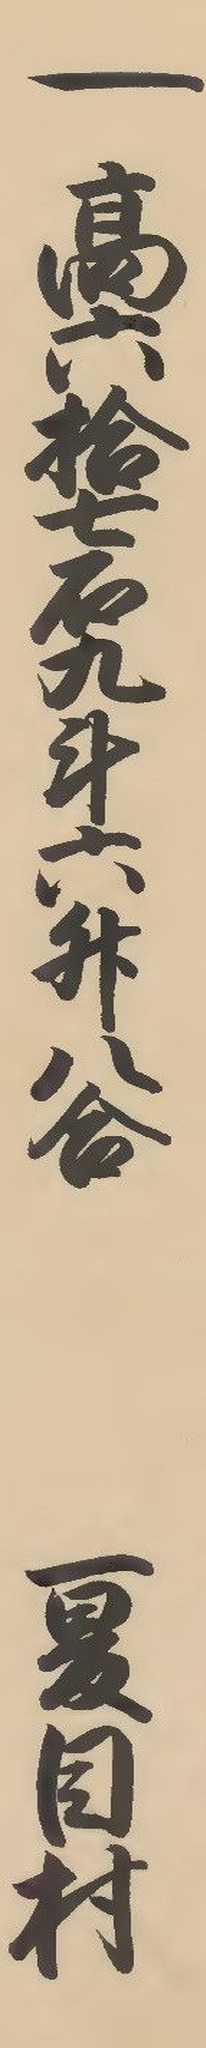一高六拾七石九斗六升八合夏目村
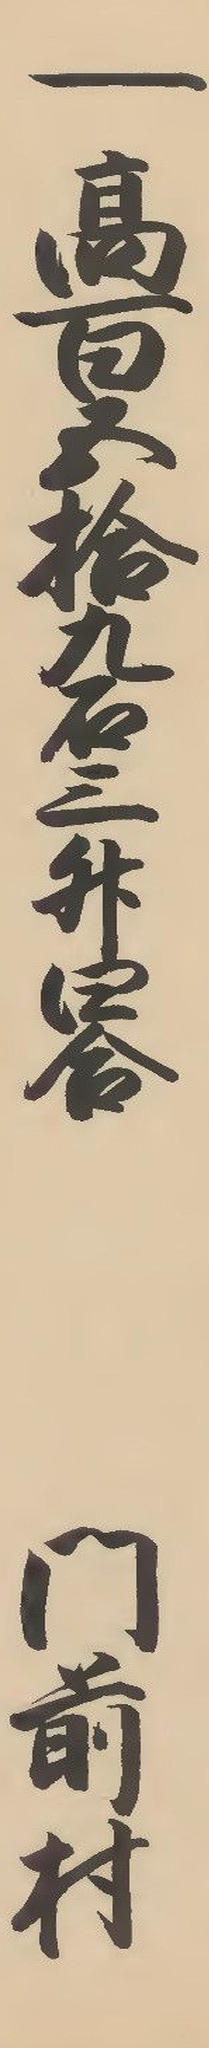一高百五拾九石三升四合門前村
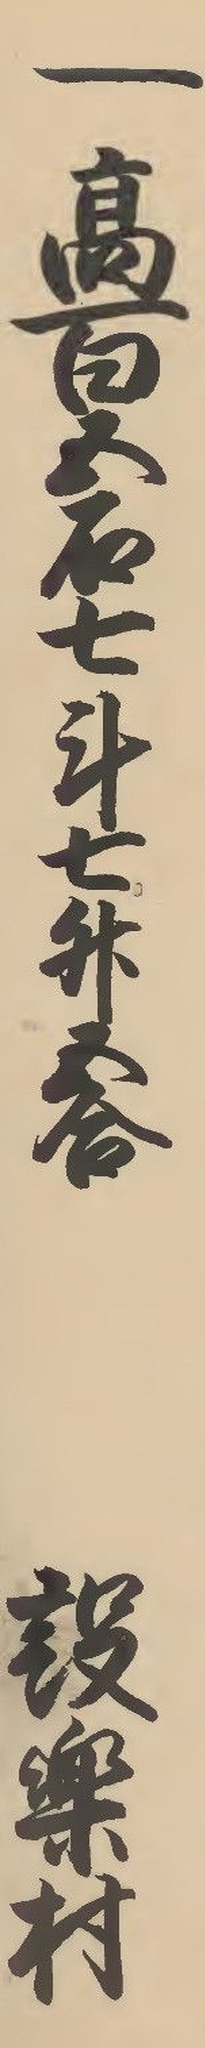一高百五石七斗七升五合設楽村
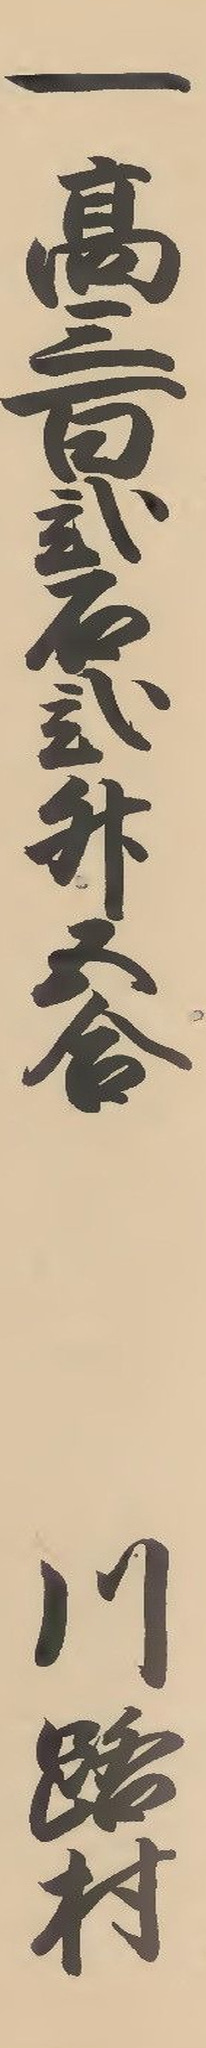一高三百弐石弐升五合川路村
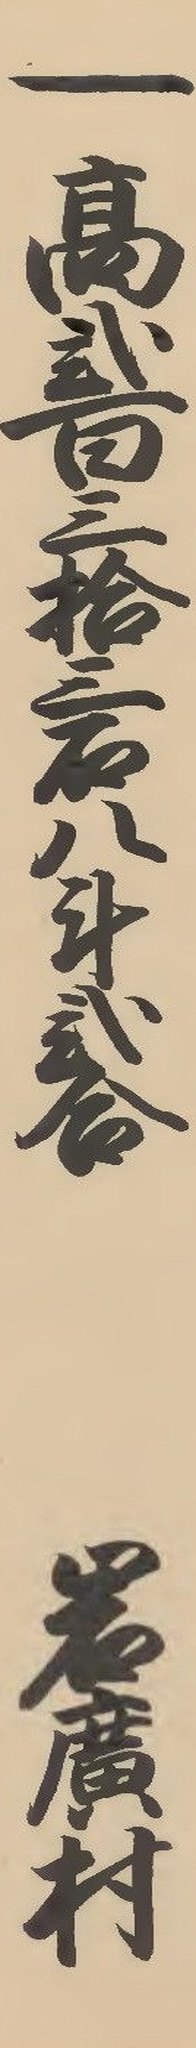一高弐百三拾三石八斗弐合岩広村
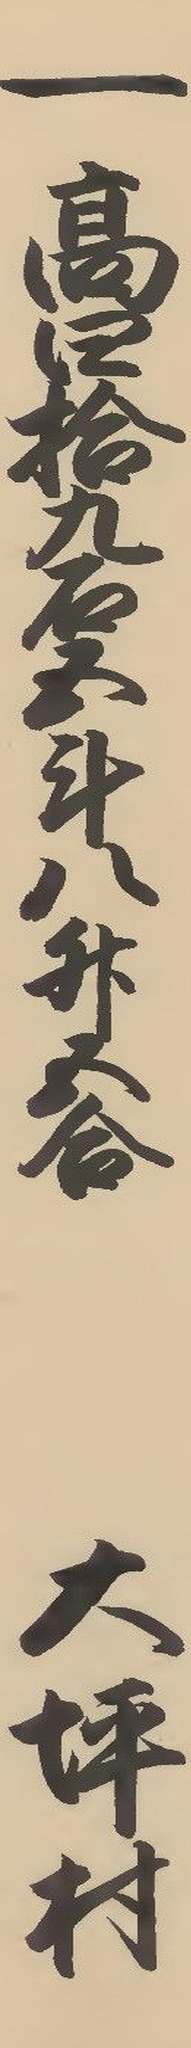一高四拾九石五斗八升五合大坪村
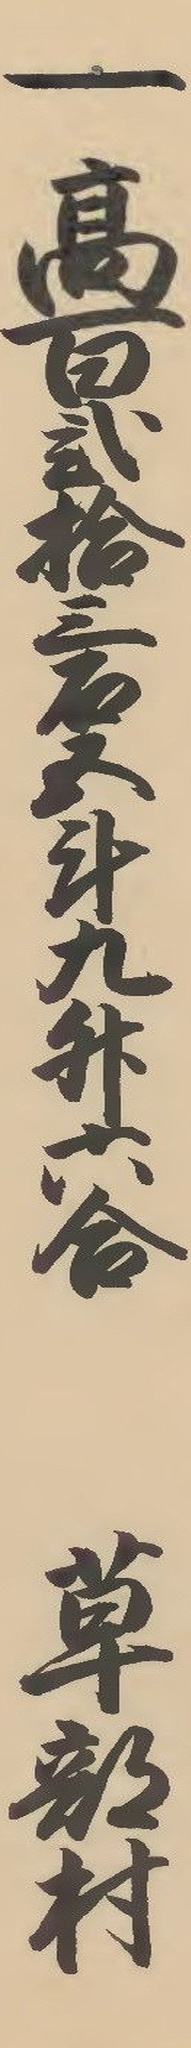一高百弐拾三石五斗九升六合草部村

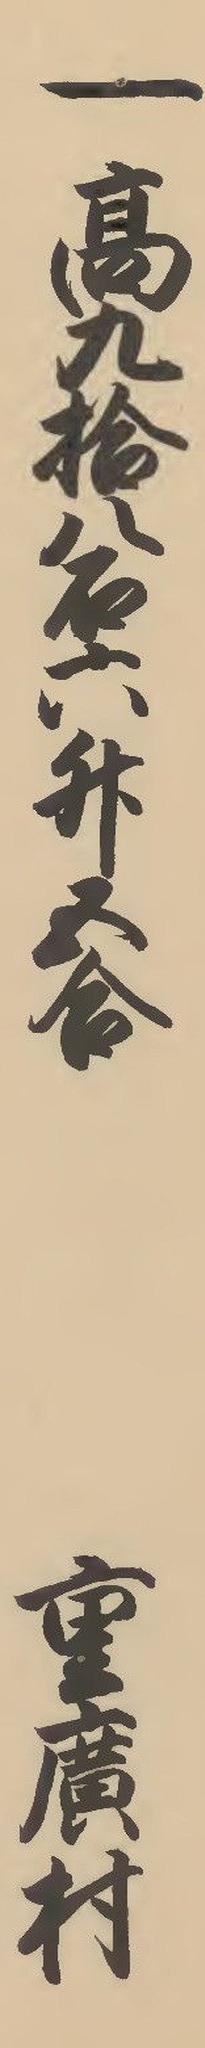一高九拾八石六升五合重広村
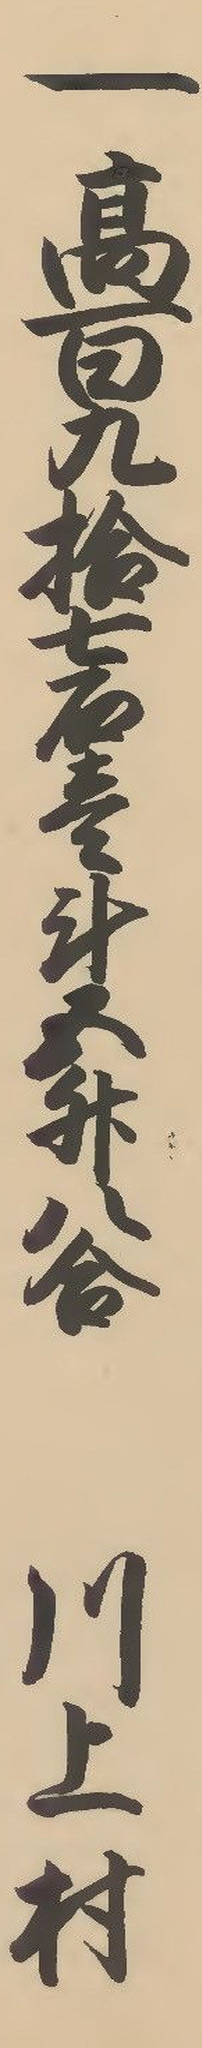一高百九拾七石壱斗五升八合川上村
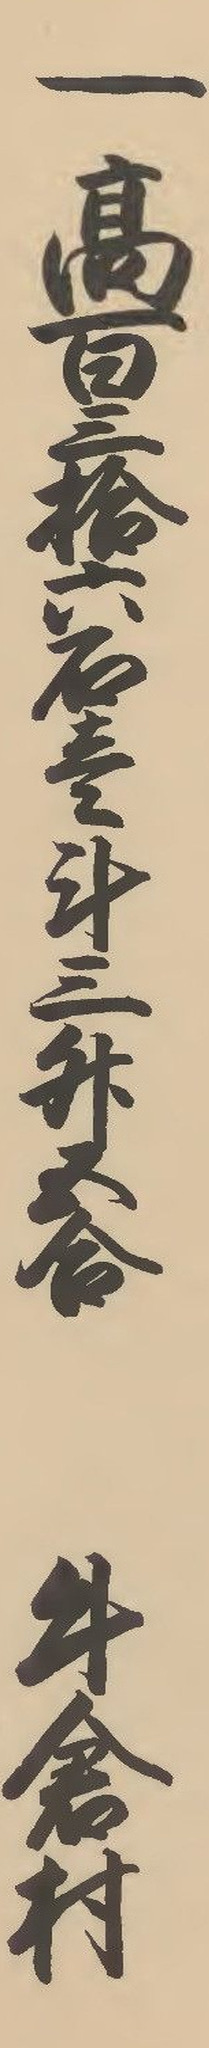一高百三拾六石壱斗三升五合牛倉村
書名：三河国郷帳
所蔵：国立公文書館 National Archives of Japan
